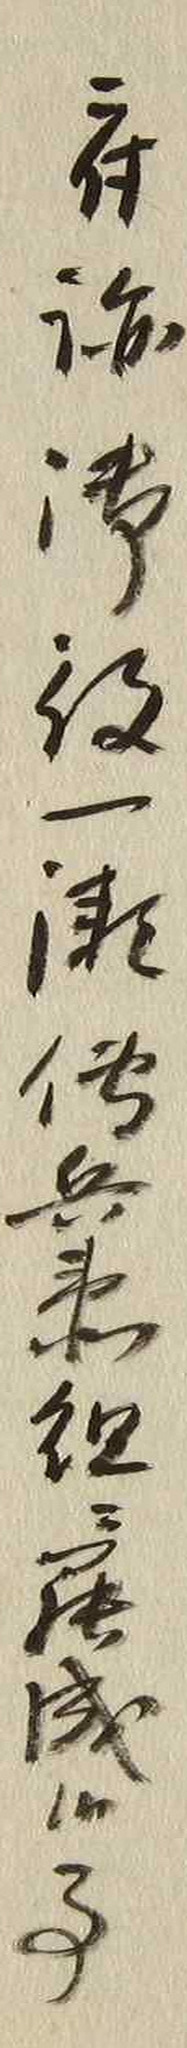に付跡御役一瀬伝兵衛組に罷成候事
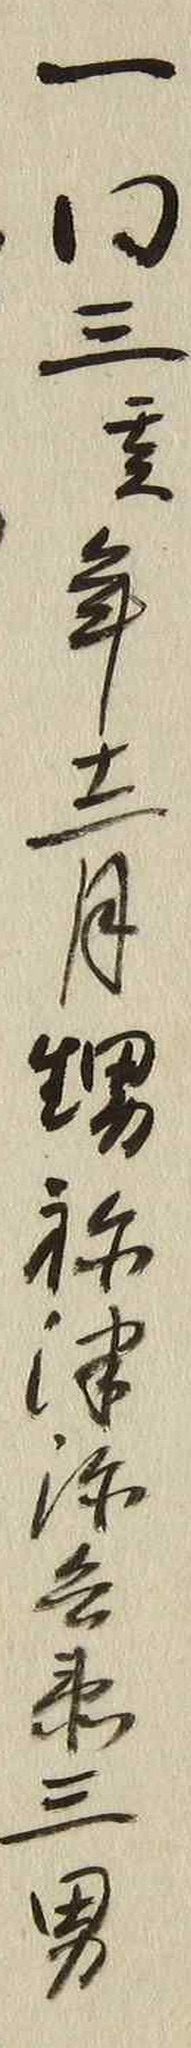一同三亥年十二月甥祢津弥兵衛三男
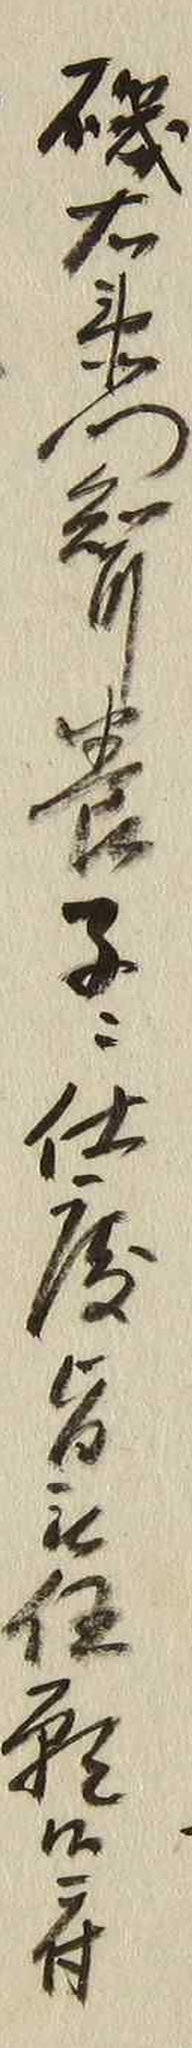磯右衛門聟養子に仕度旨任願候に付
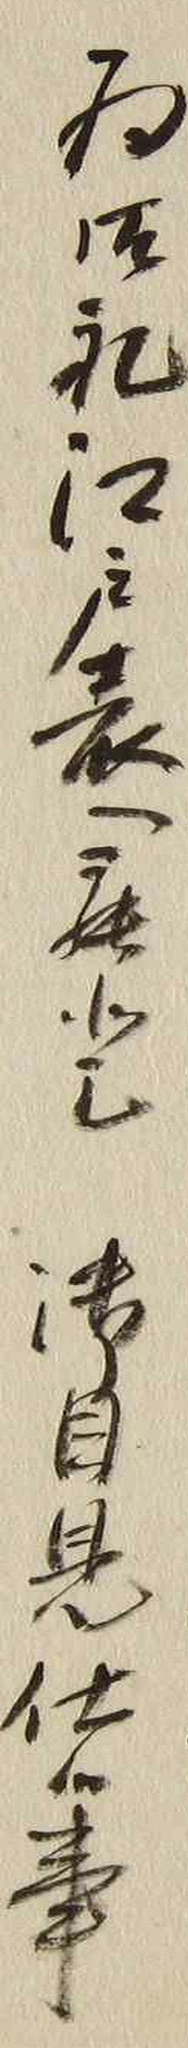為御礼江戸表へ罷登御目見仕候事
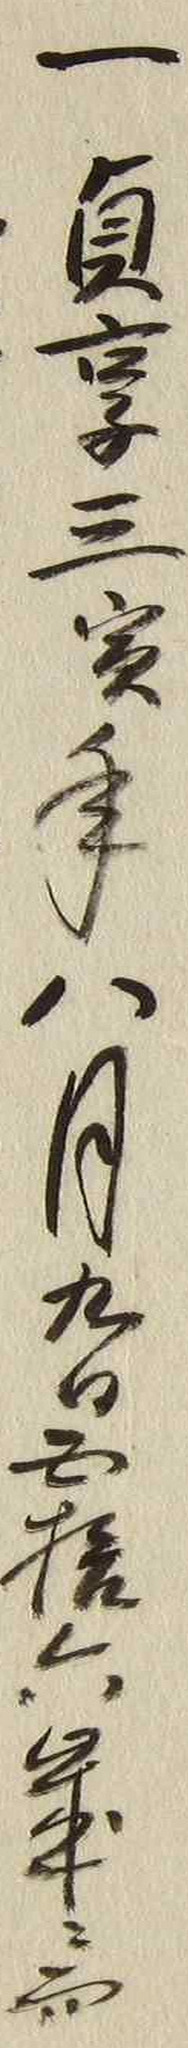一貞享三寅年八月九日五拾六歳に而
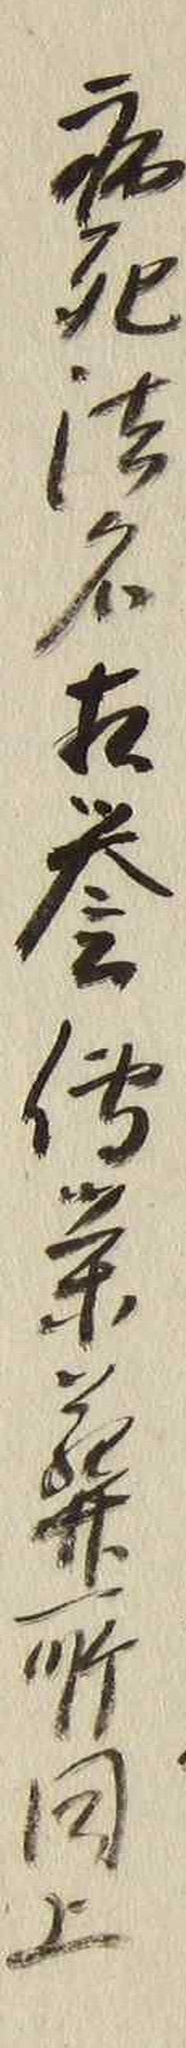病死法名古誉伝栄葬所同上
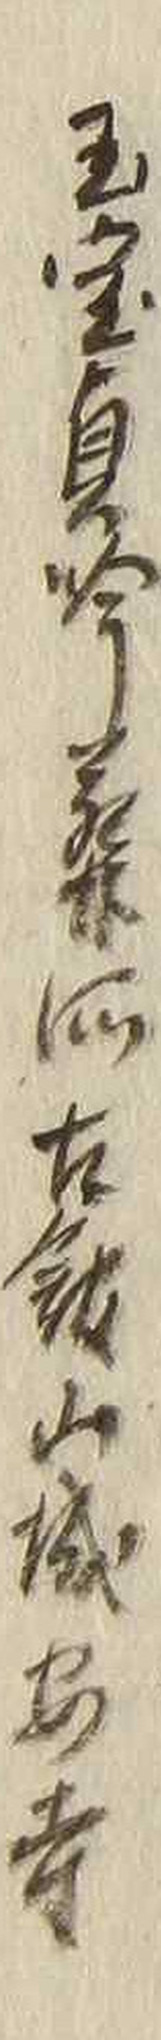玉宝貞吟葬所古館山城安寺

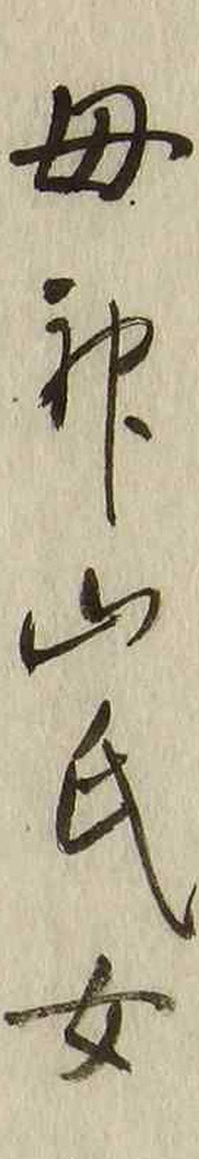母神山氏女
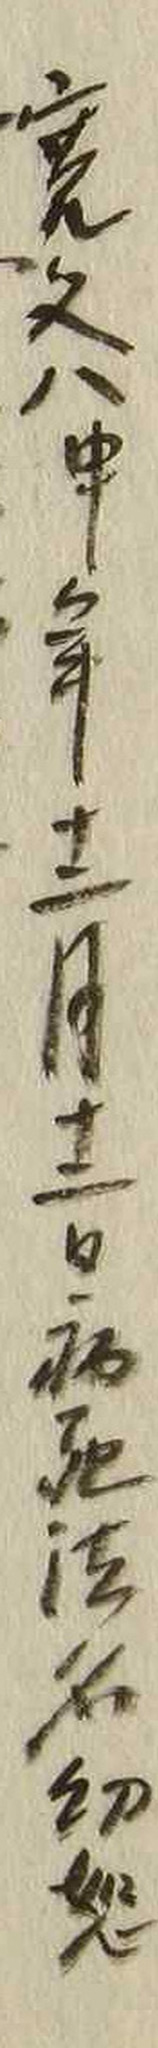女寛文八申年十二月十二日病死法名幼恕
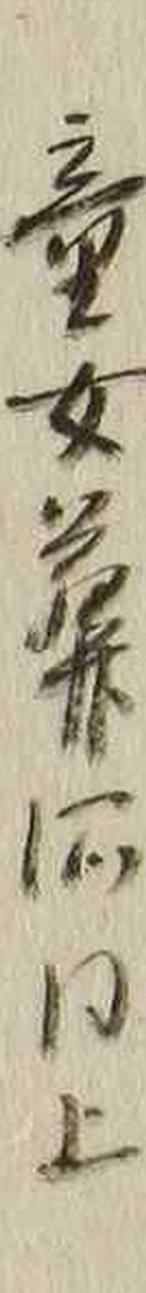童女葬所同上
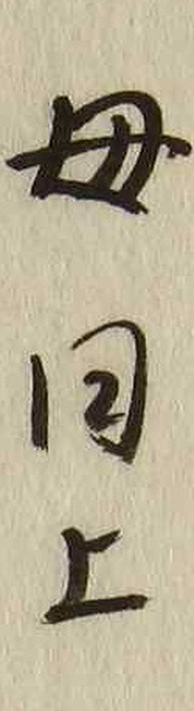母同上
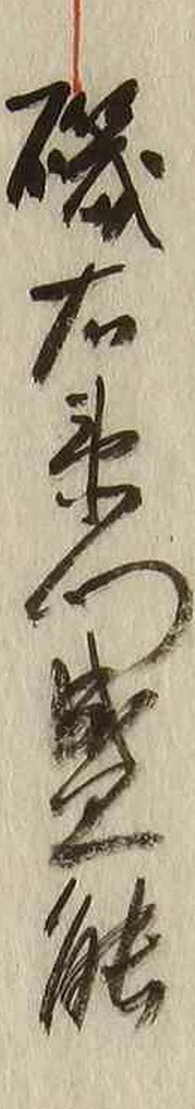磯右衛門盛能
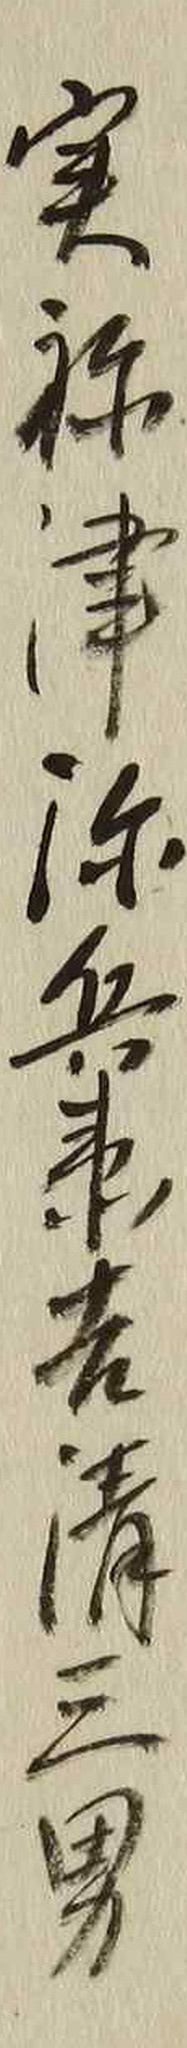実祢津弥兵衛吉清三男
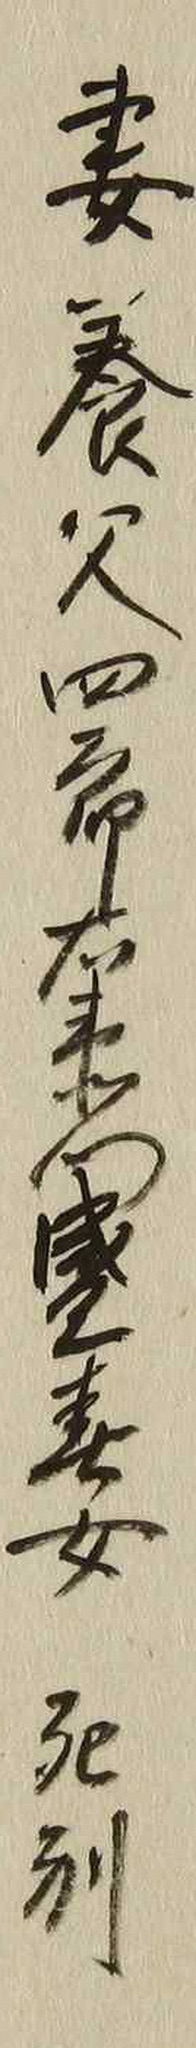妻養父四郎右衛門盛妻女死別
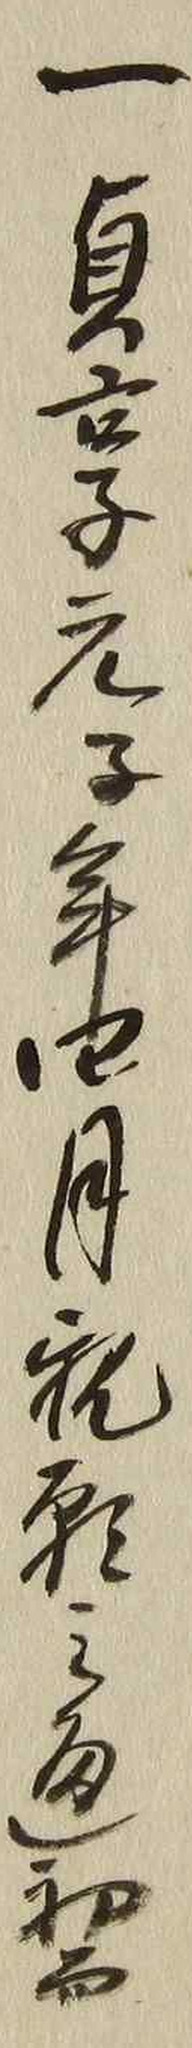一貞享元子年四月親願之通初而
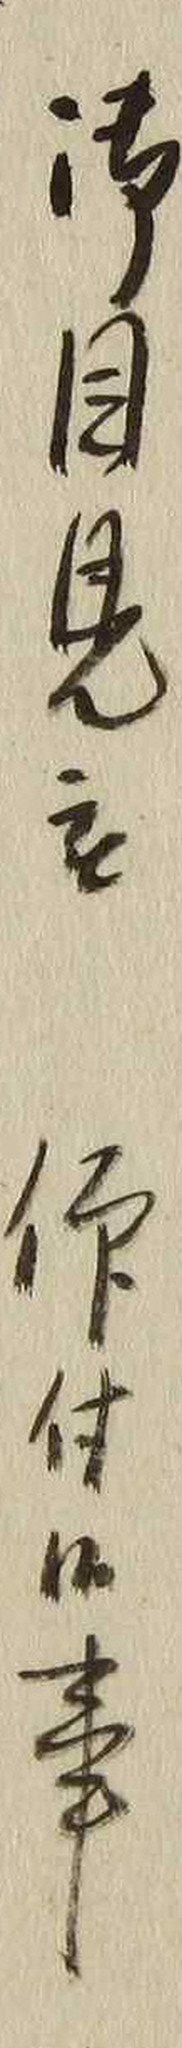之御目見被仰付候事
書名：諸士系譜　巻之360　す之部10
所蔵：会津若松市立会津図書館
